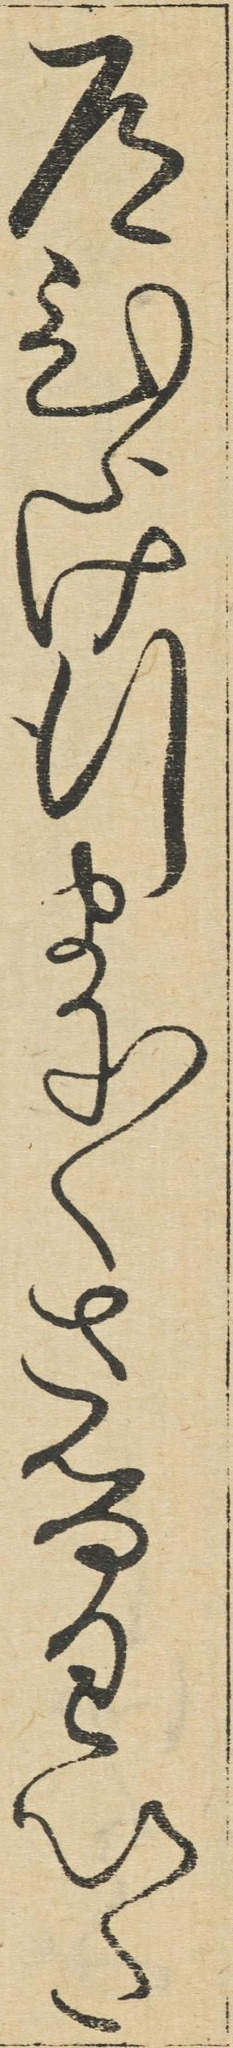道ひらけ行まに〳〵さるわいた
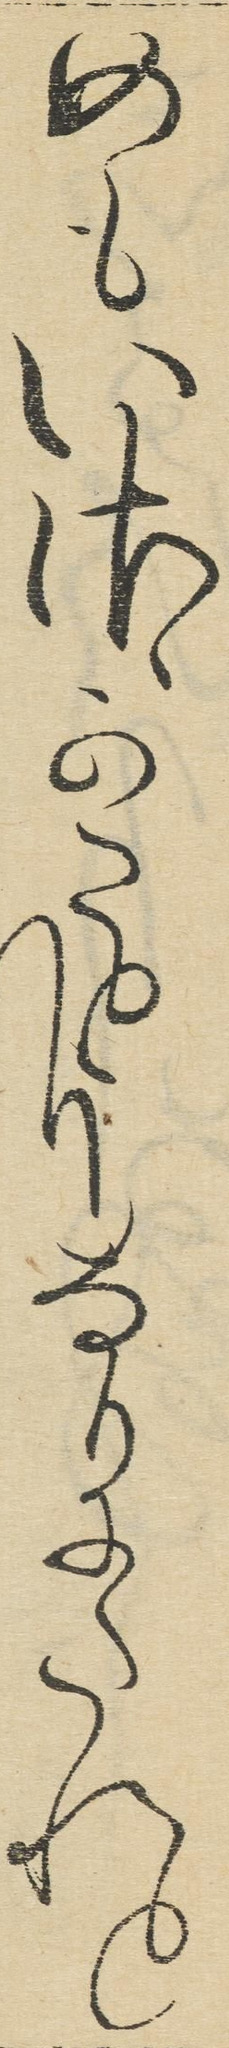めもいさゝかことになりにたれと
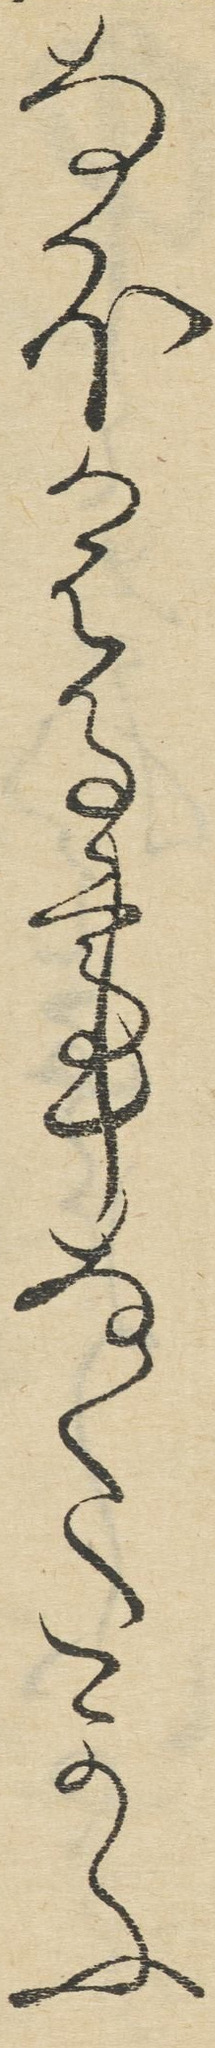なほかはる事なくたかふ
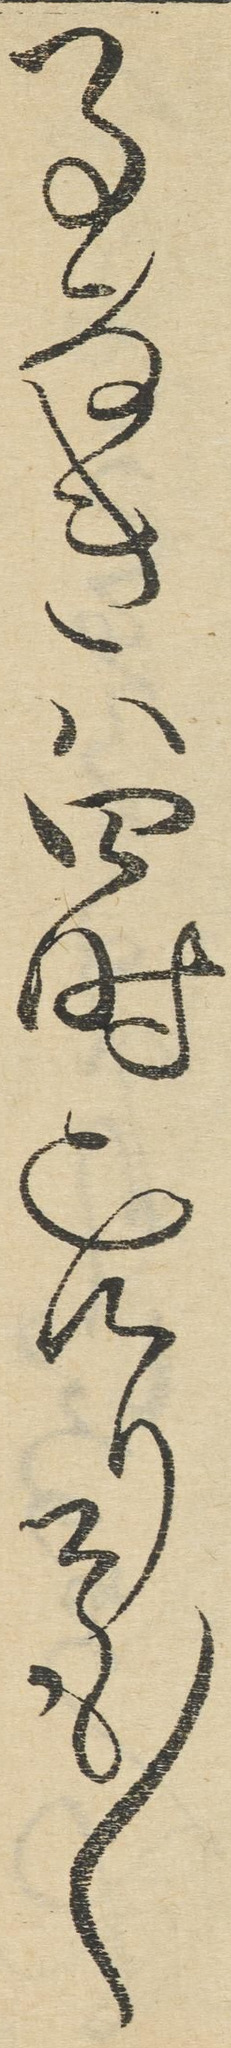事なきは四時也けりそも〳〵
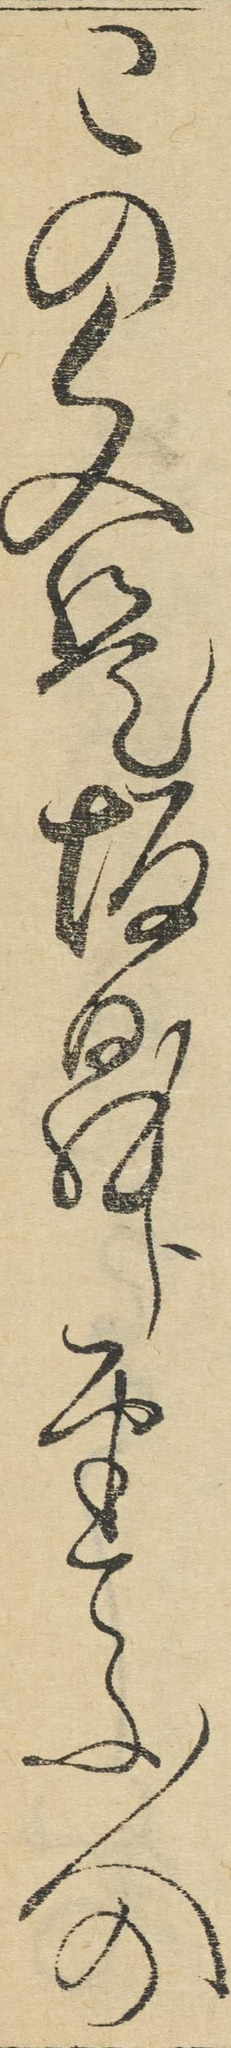この文は坂昇平てふ人の
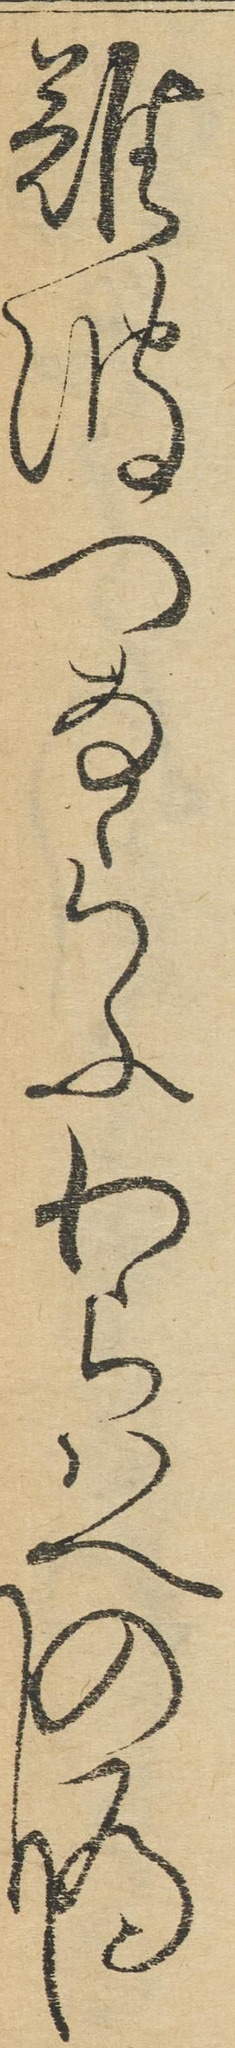難波つならふわらはへの為に

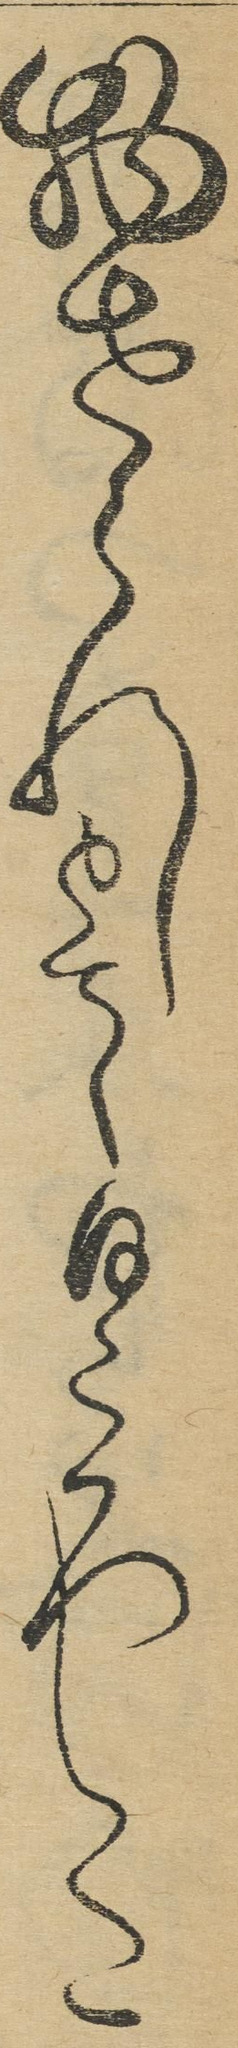物せられしとて日ころした
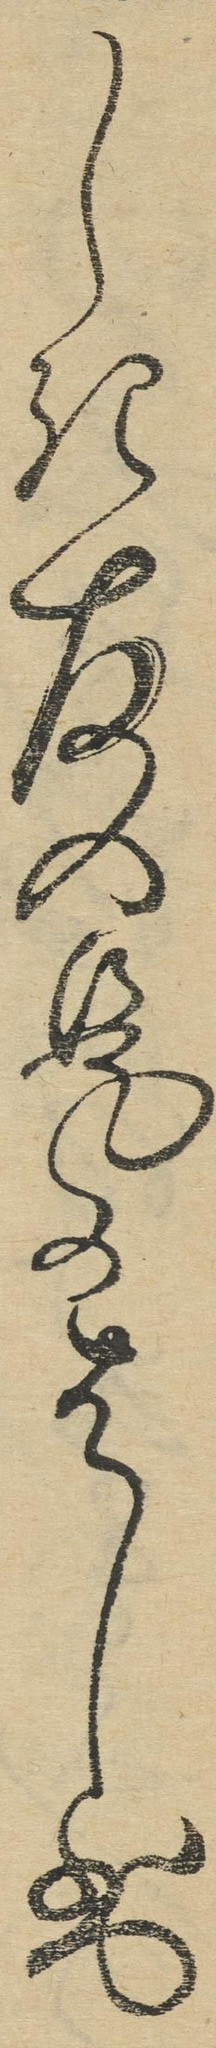しき友のいひかはし書
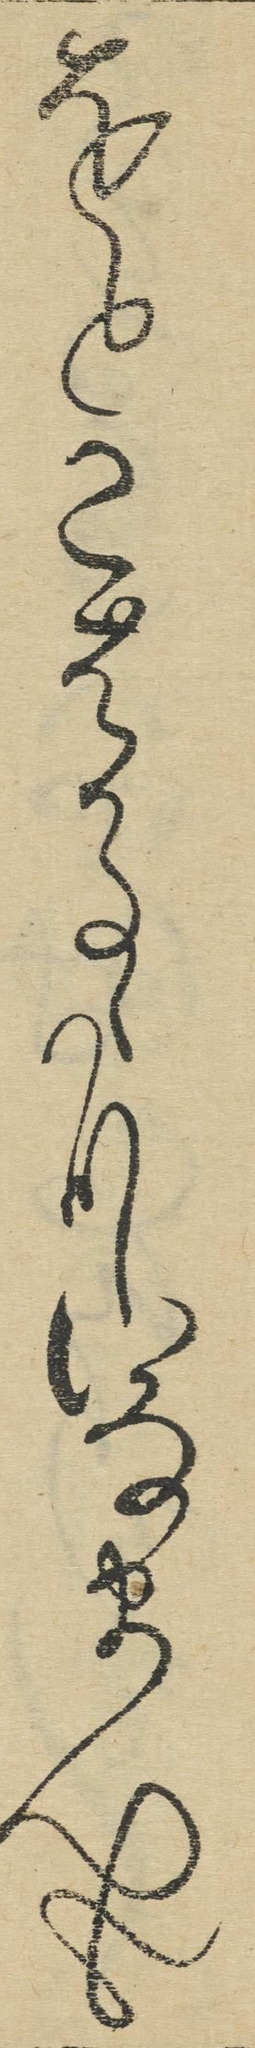をとこはるゝにいなまんも
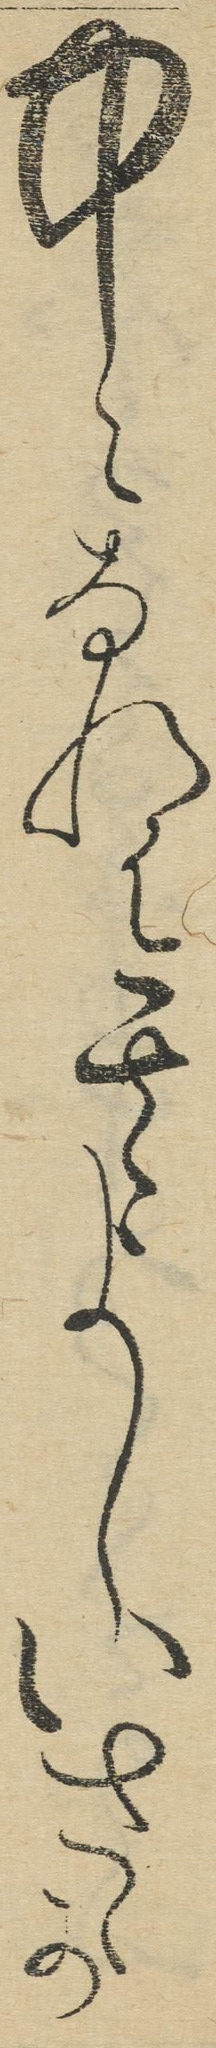中々なれは其よしいさゝか
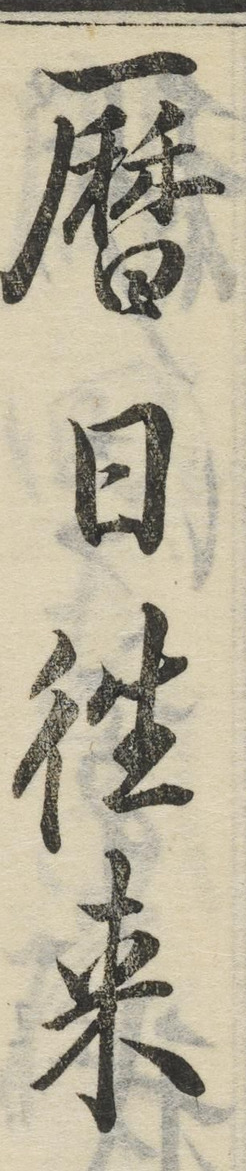暦日往来
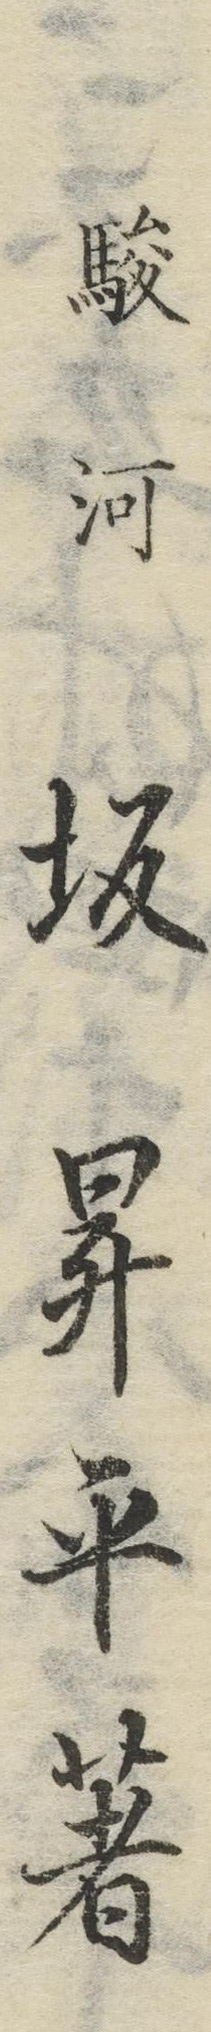駿河坂昇平著
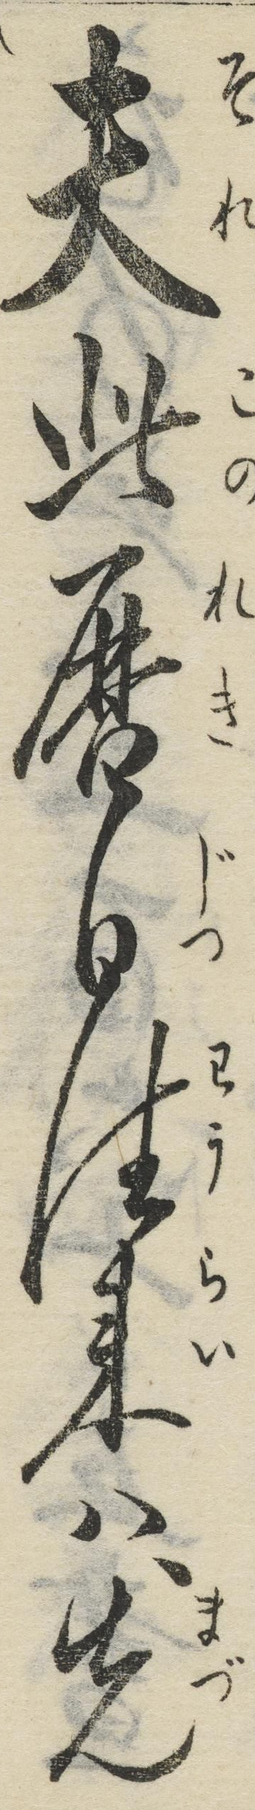夫此暦日往来は、先
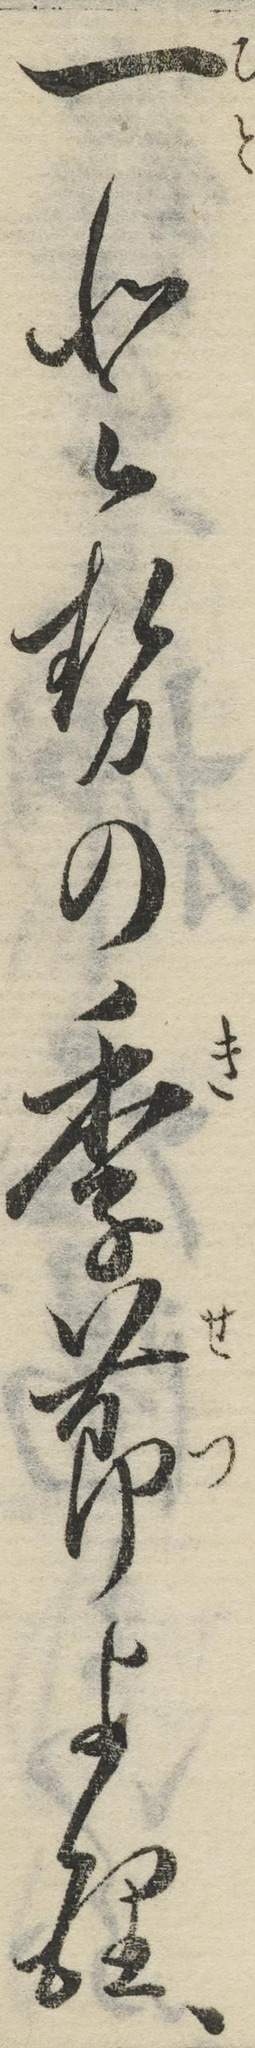一とせの季節より、
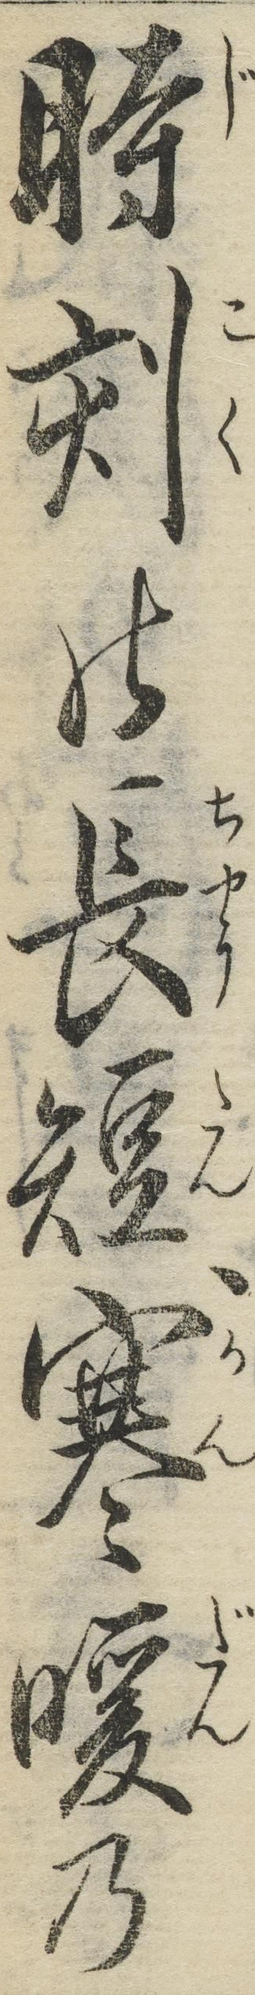時刻の長短、寒暖の

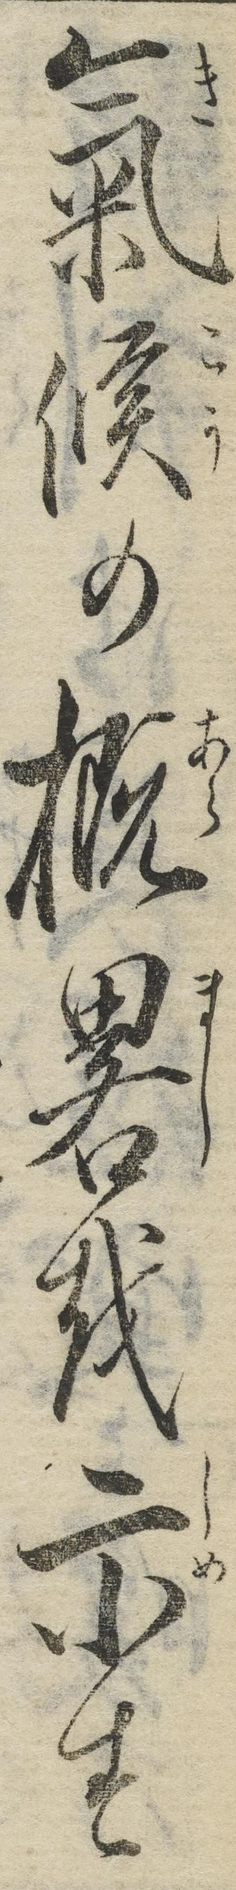気候の概略を示す
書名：暦日往来　單
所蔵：東京大学地震研究所図書室 Earthquake Research Institute Library, The University of Tokyo, JAPAN
